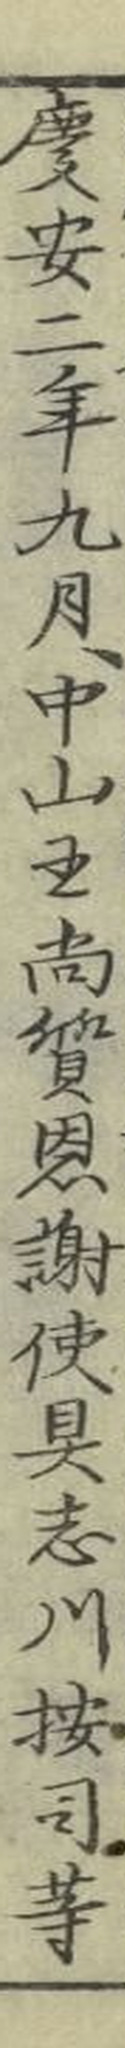慶安二年九月、中山王尚質、恩謝使具志川按司等
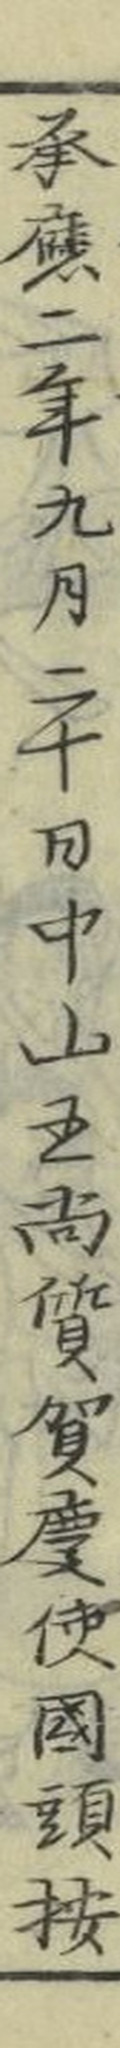承応二年九月二十日、中山王尚質、賀慶使国頭按
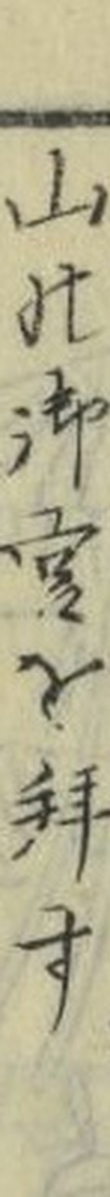山の御宮を拝す、
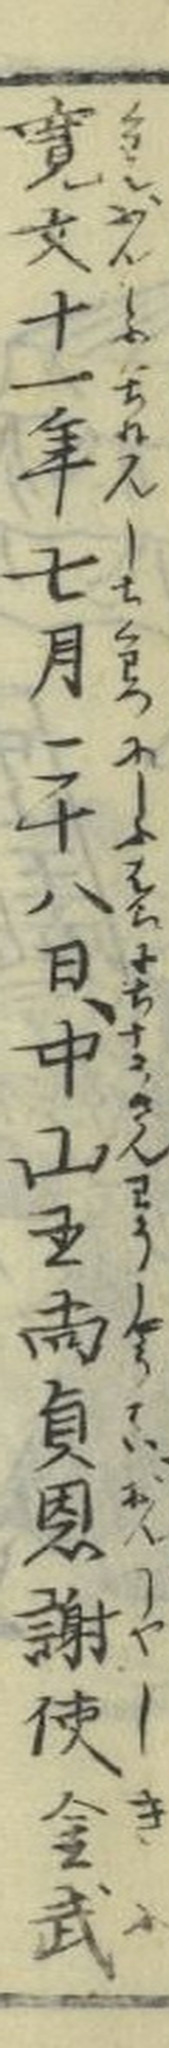寛文十一年七月二十八日、中山王尚貞、恩謝使金武
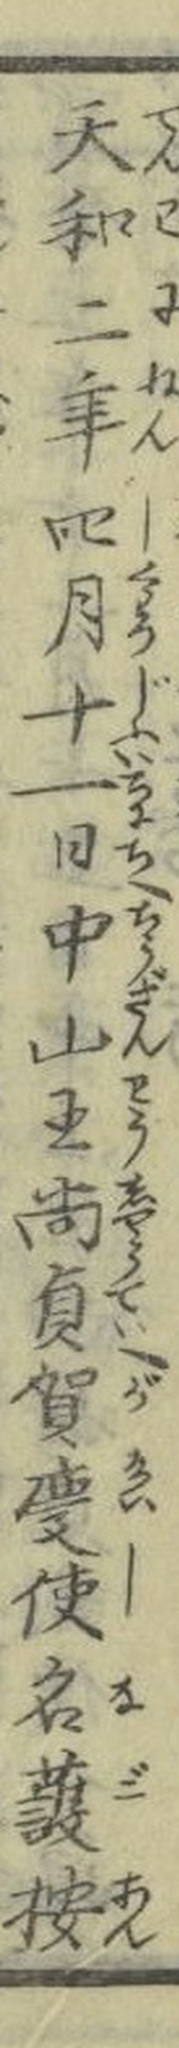天和二年四月十一日、中山王尚貞、賀慶使名護按
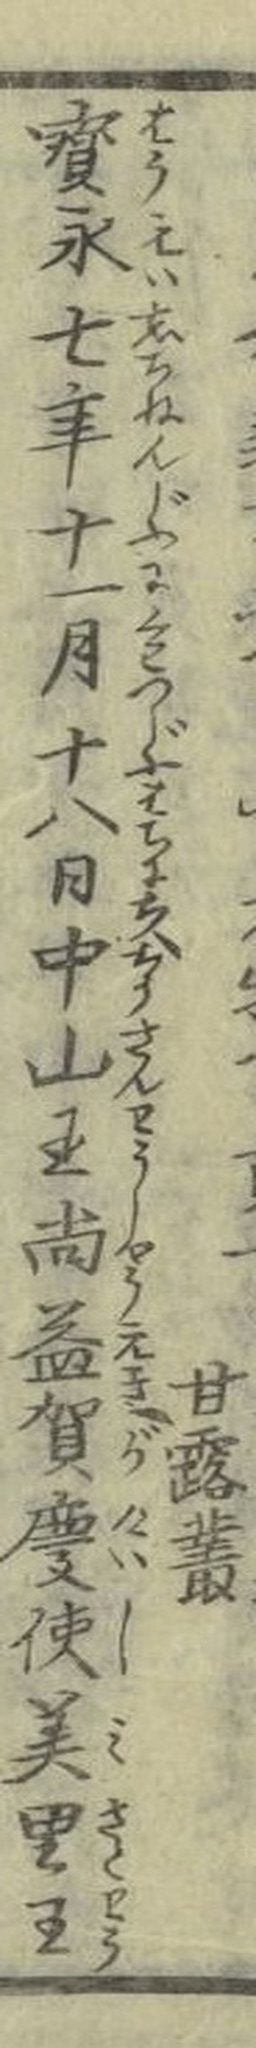宝永七年十一月十八日、中山王尚益、賀慶使美里王
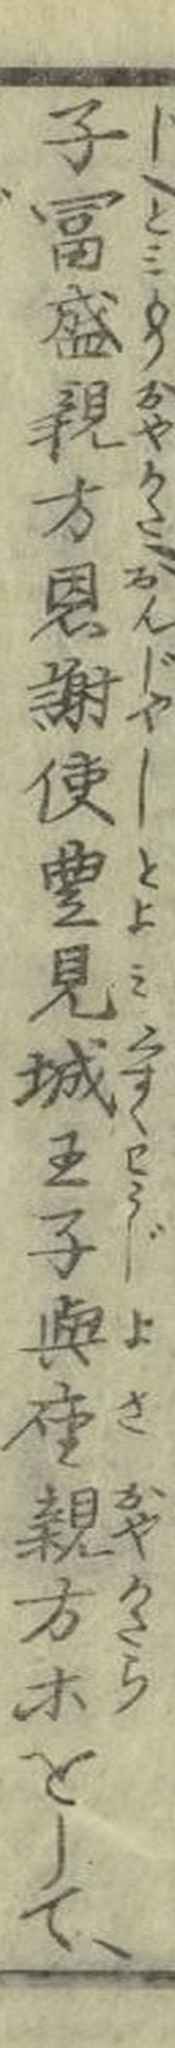子、富盛親方、恩謝使豊見城王子与座親方等をして、
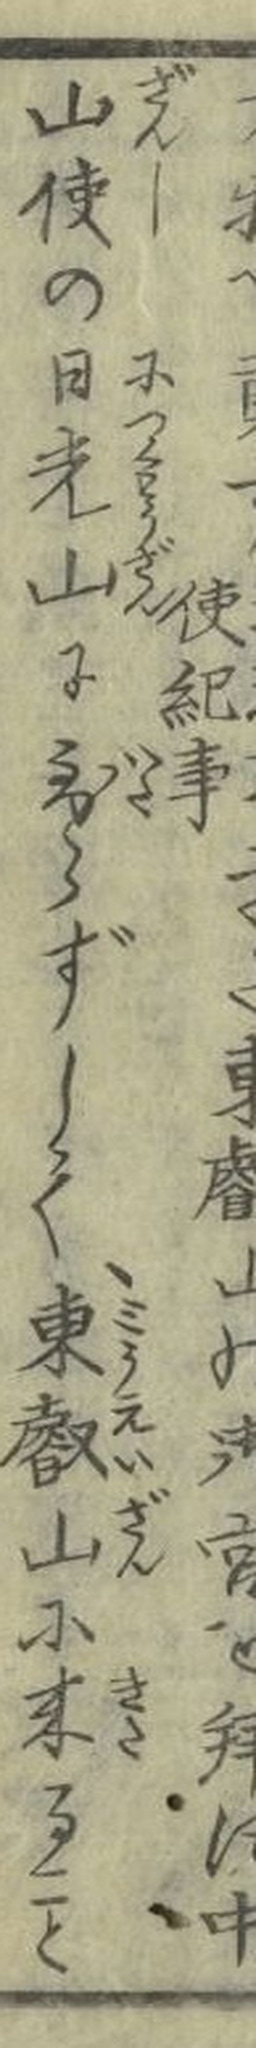山使の日光山に至らずして、東叡山に来ること
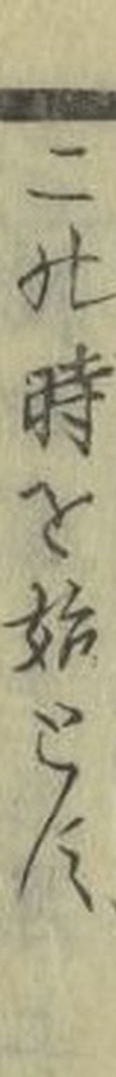この時を始とす、

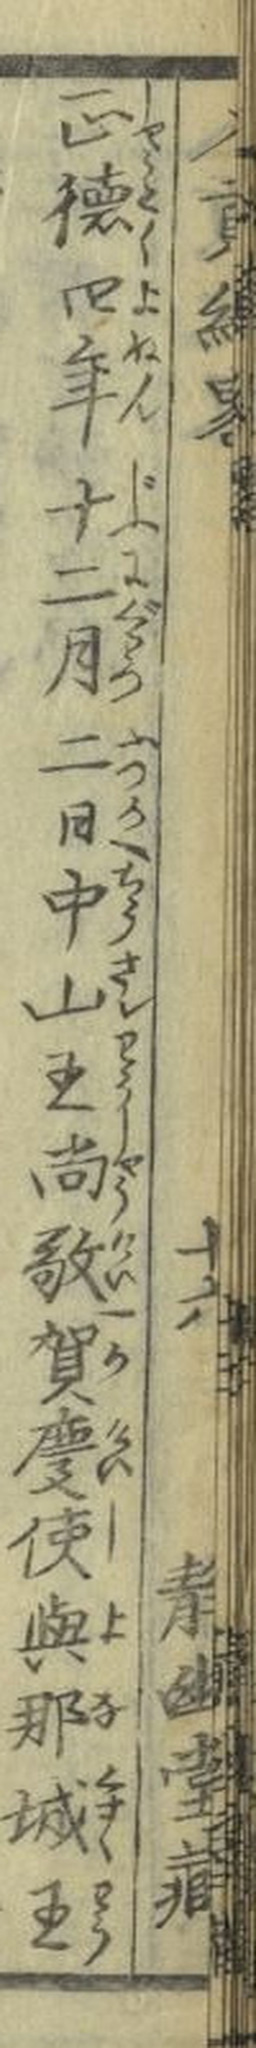正徳四年十二月二日、中山王尚敬、賀慶使与那城王
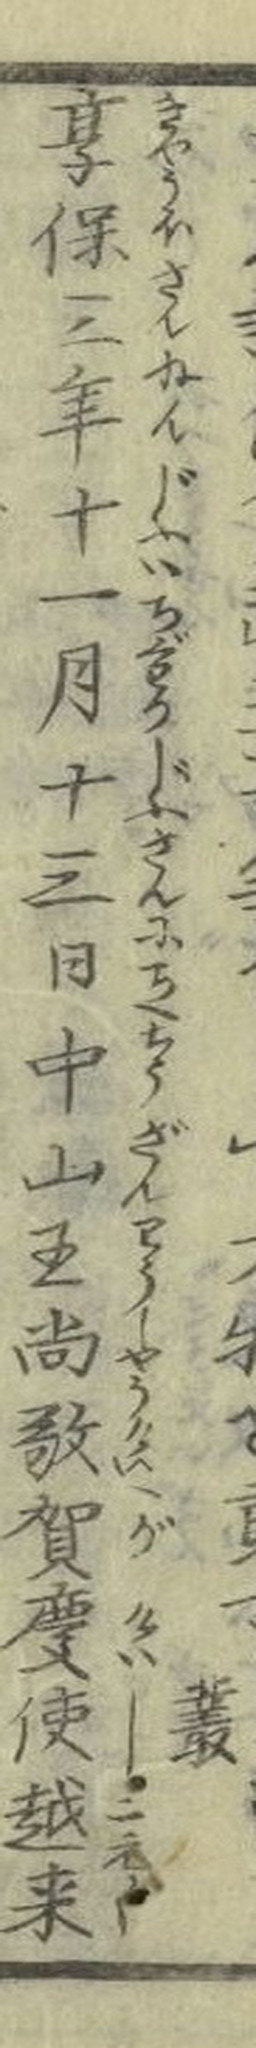享保三年十一月十三日、中山王尚敬、賀慶使越来
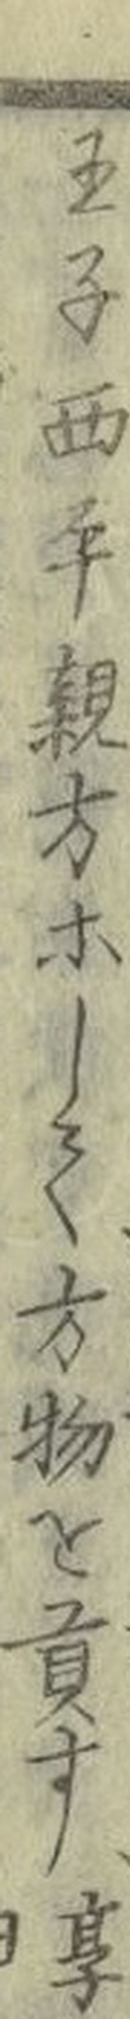山王子小録親方等をして、方物を貢す、
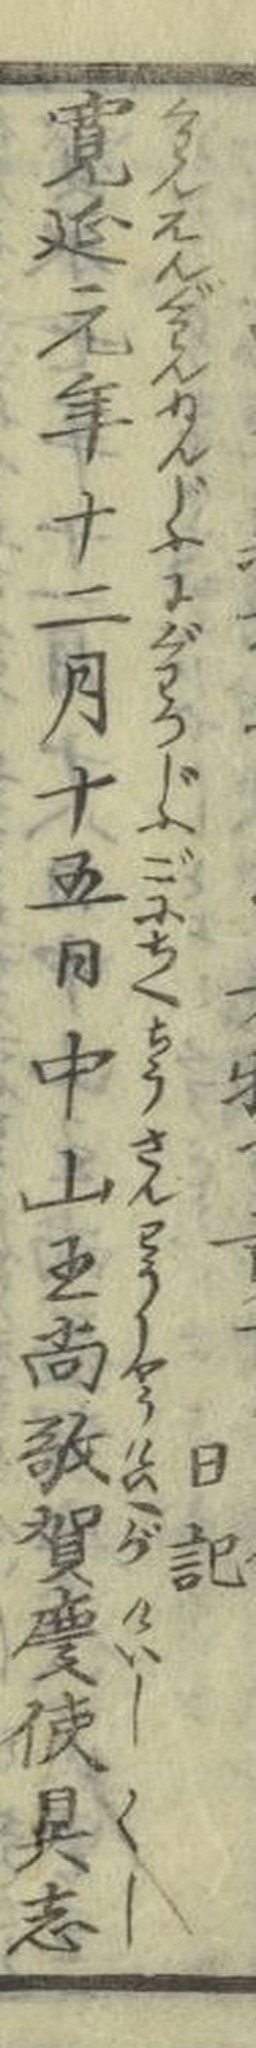寛延元年十二月十五日、中山王尚敬、賀慶使具志
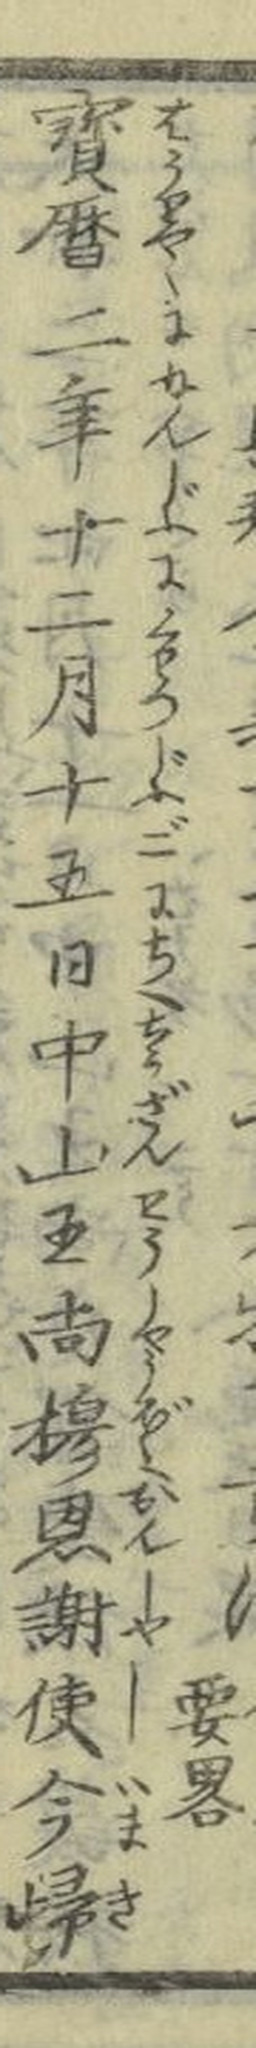宝暦二年十二月十五日、中山王尚穆、恩謝使今帰
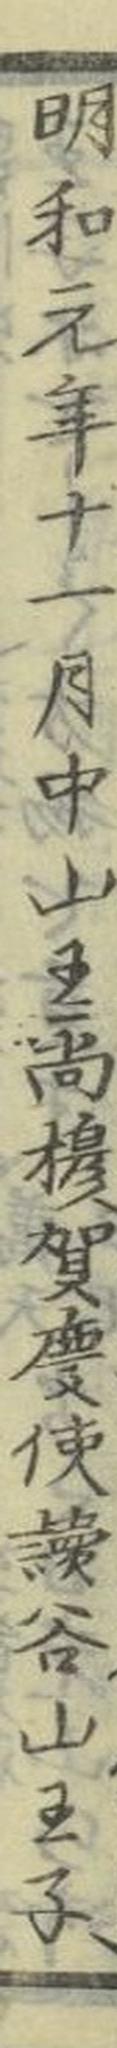明和元年十一月、中山王尚穆、賀慶使読谷山王子、
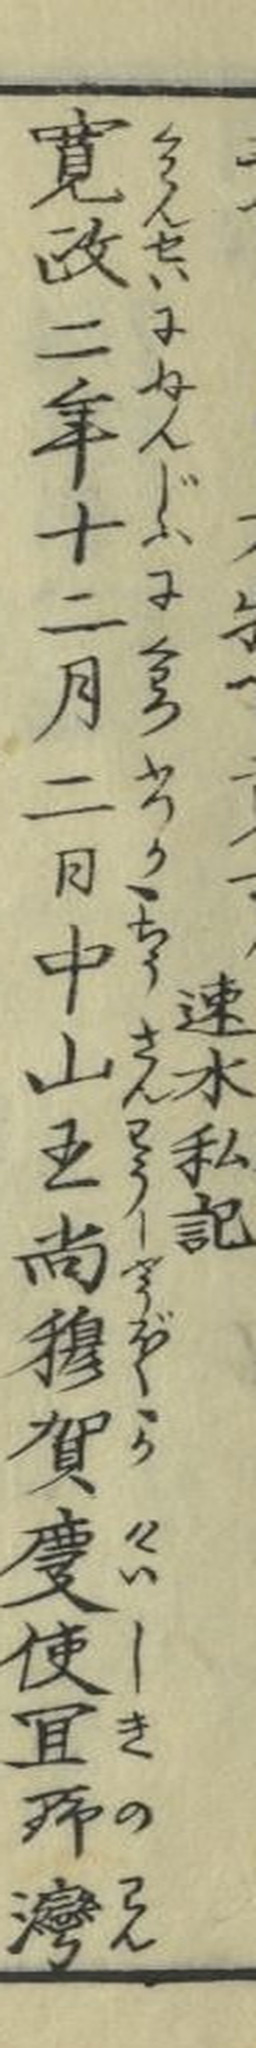寛政二年十二月二日、中山王尚穆、賀慶使宜野湾
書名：琉球入貢紀略
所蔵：University of the Ryukyus Library
